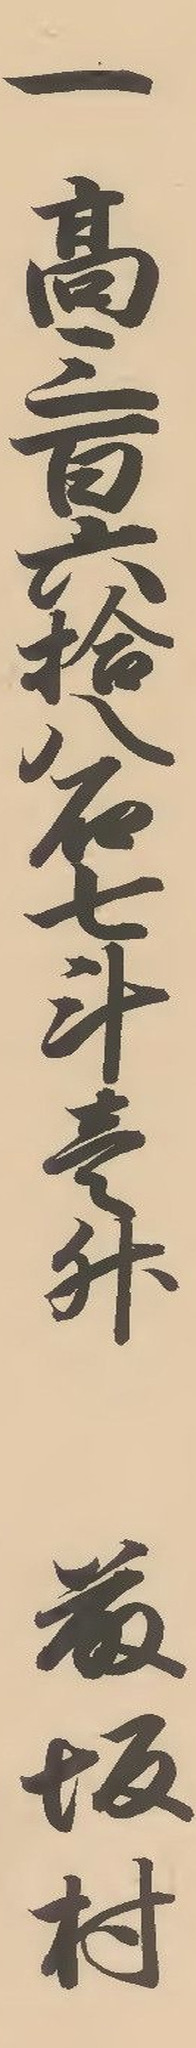一高三百六拾八石七斗壱升藤坂村
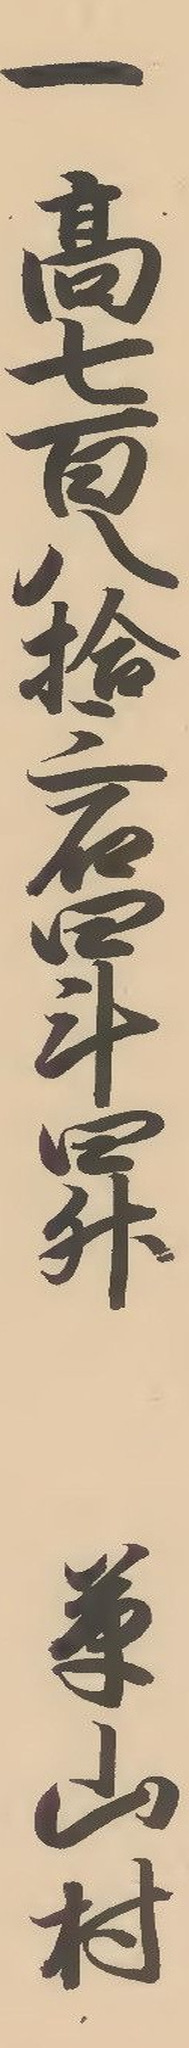一高七百八拾三石四斗四升草山村

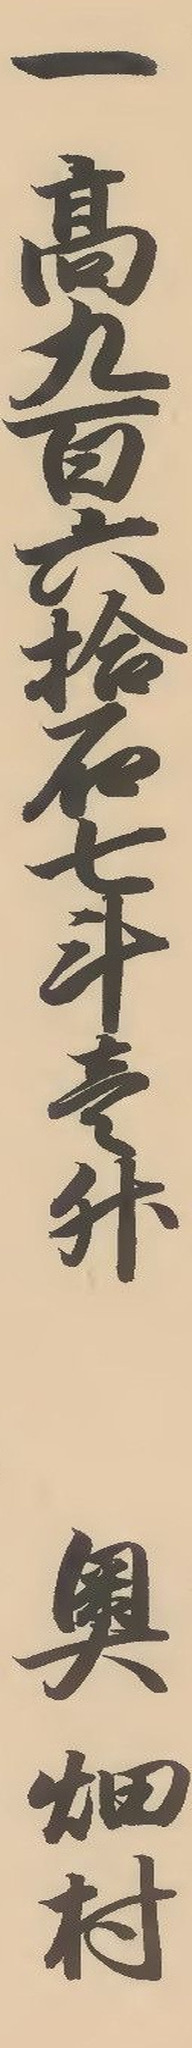一高九百六拾石七斗壱升奥畑村
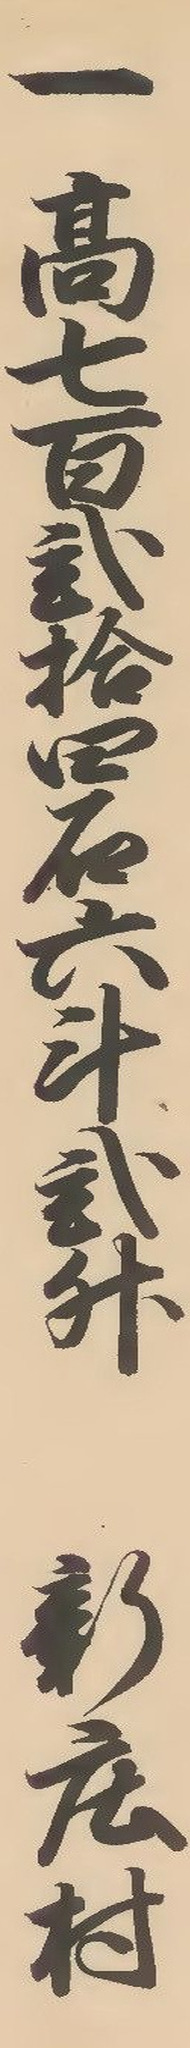一高七百弐拾四石六斗弐升新庄村
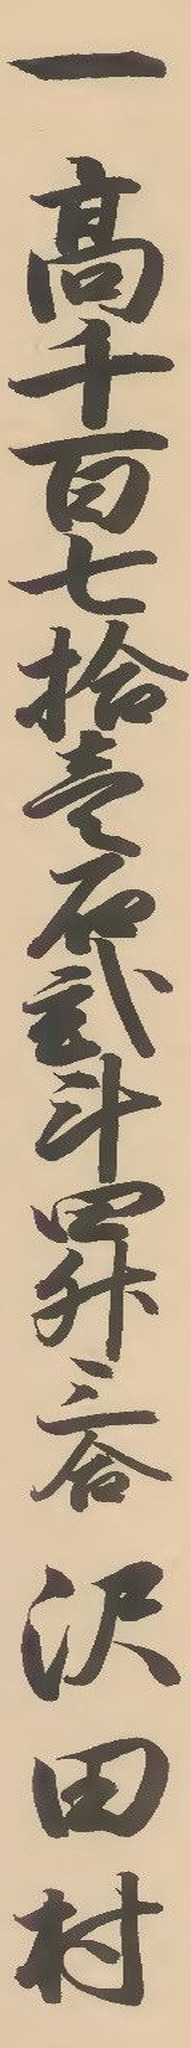一高千百七拾壱石弐斗四升三合沢田村
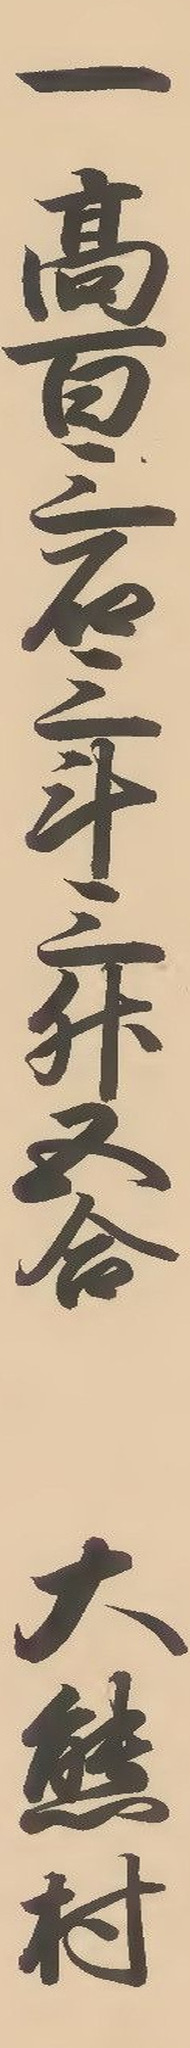一高百三石三斗三升五合大熊村
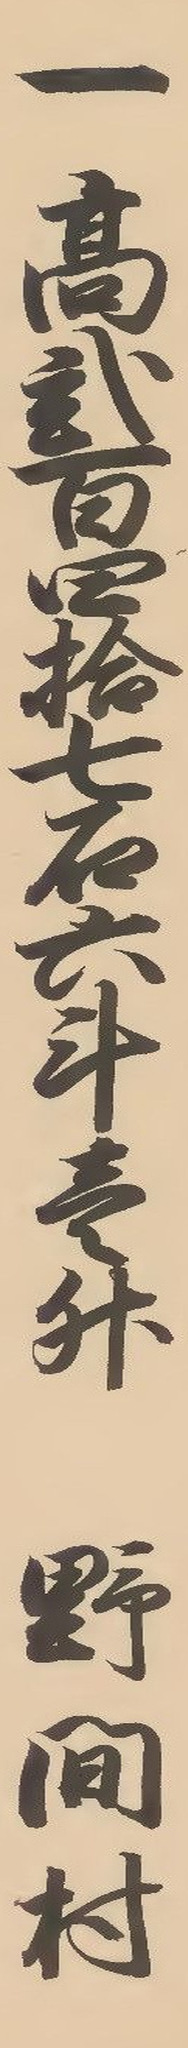一高弐百四拾七石六斗壱升野間村
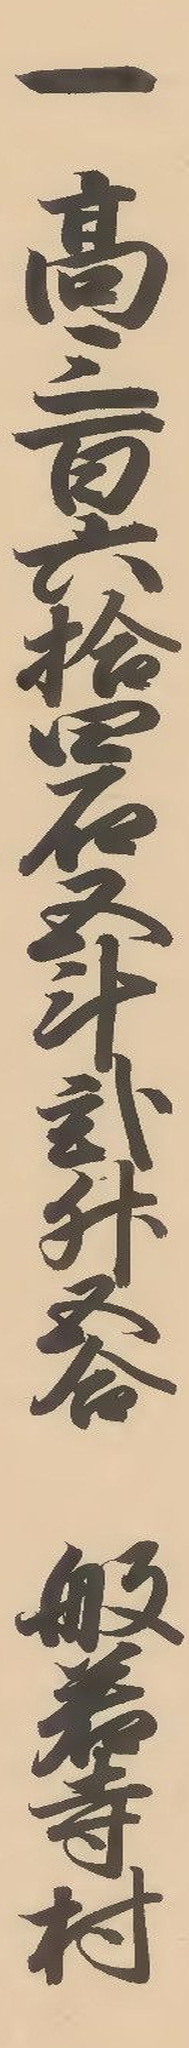一高三百六拾四石五斗弐升五合般若寺村
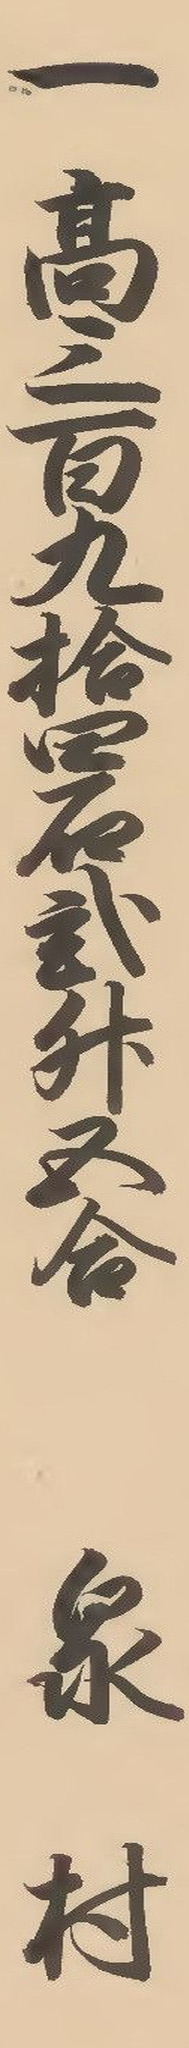一高三百九拾四石弐升五合泉村

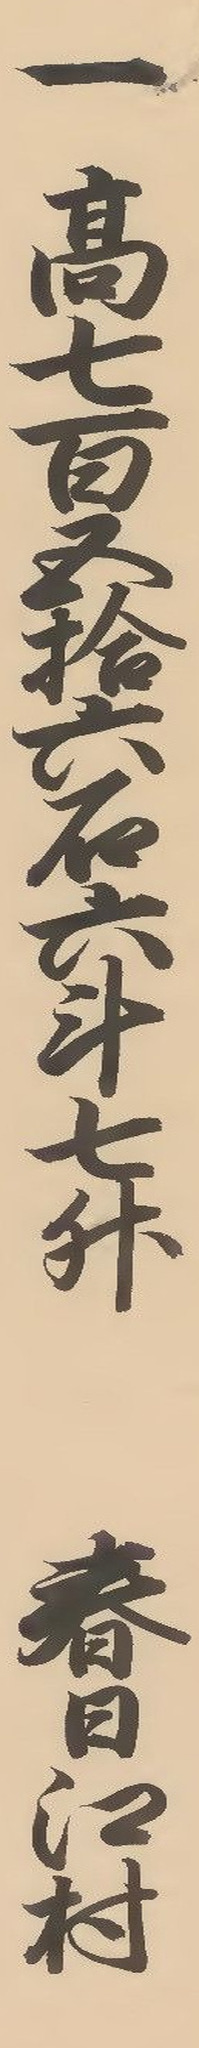一高七百五拾六石六斗七升春日江村
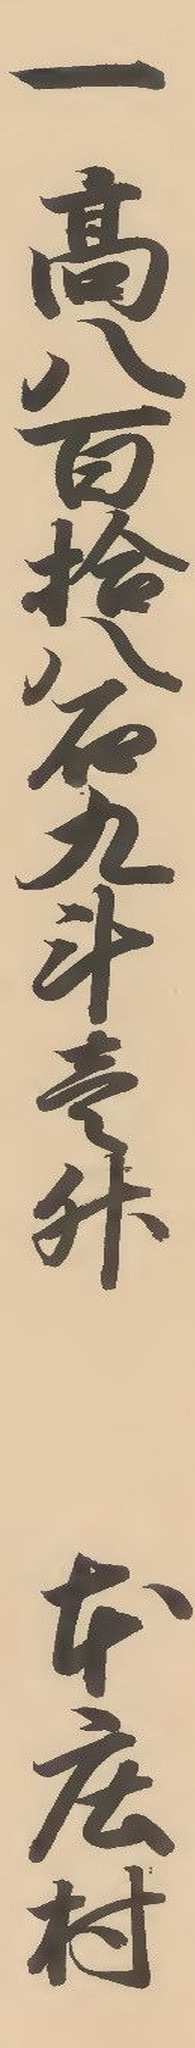一高八百拾八石九斗壱升本庄村
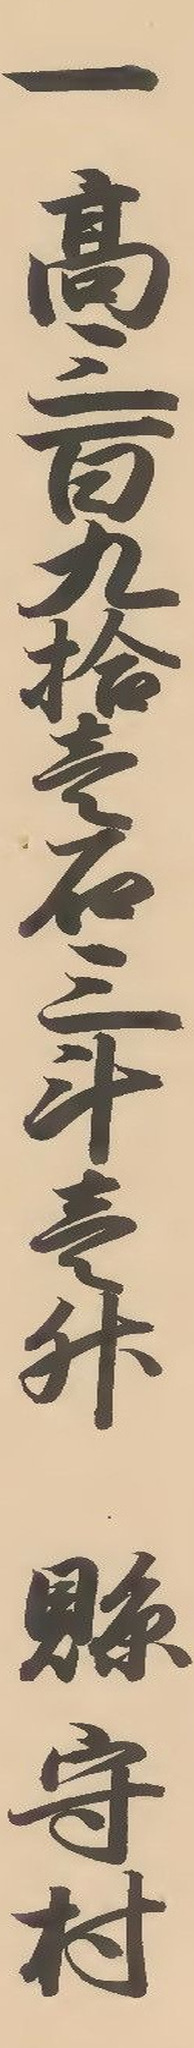一高三百九拾壱石三斗壱升県守村
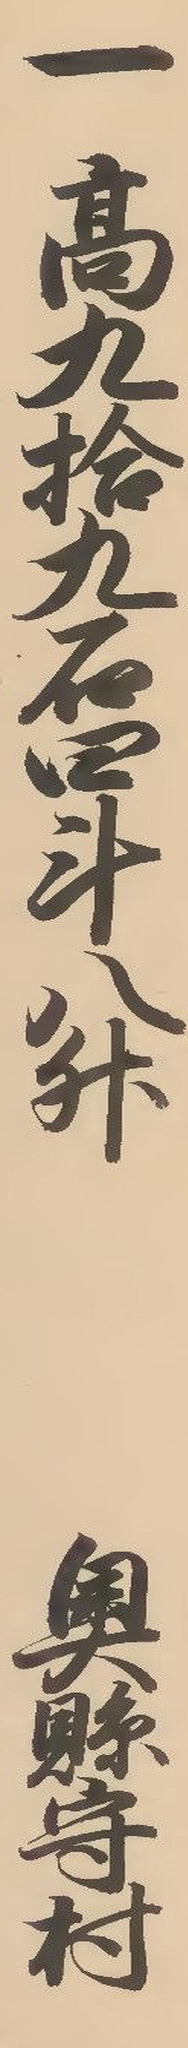一高九拾九石四斗八升奥県守村
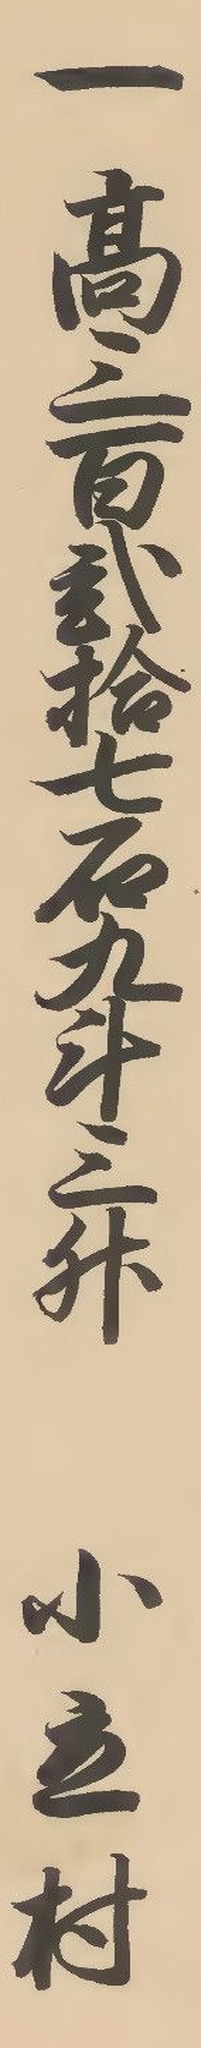一高三百弐拾七石九斗三升小立村
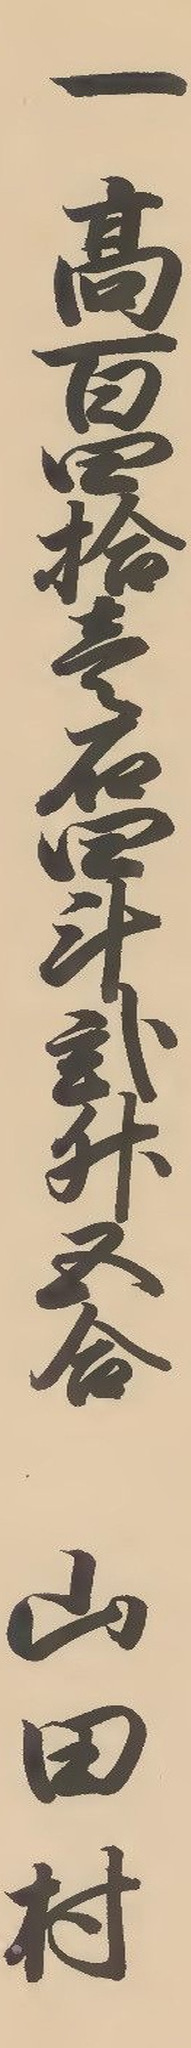一高百四拾壱石四斗弐升五合山田村

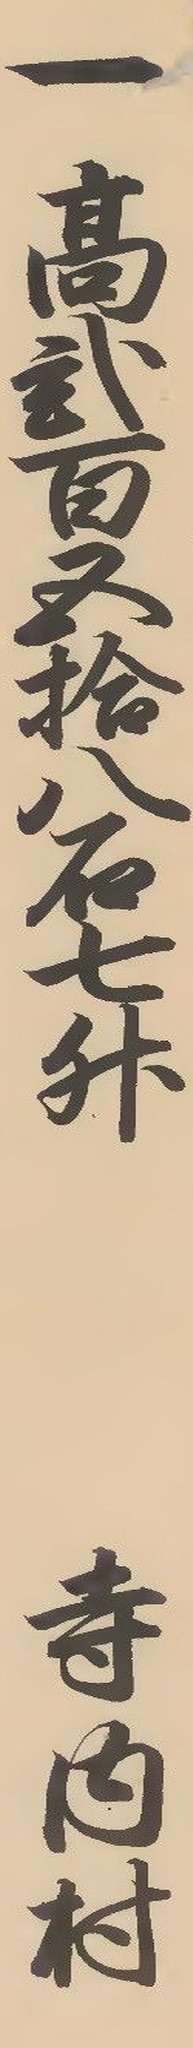一高弐百五拾八石七升寺内村
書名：丹波国郷帳
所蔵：国立公文書館 National Archives of Japan
